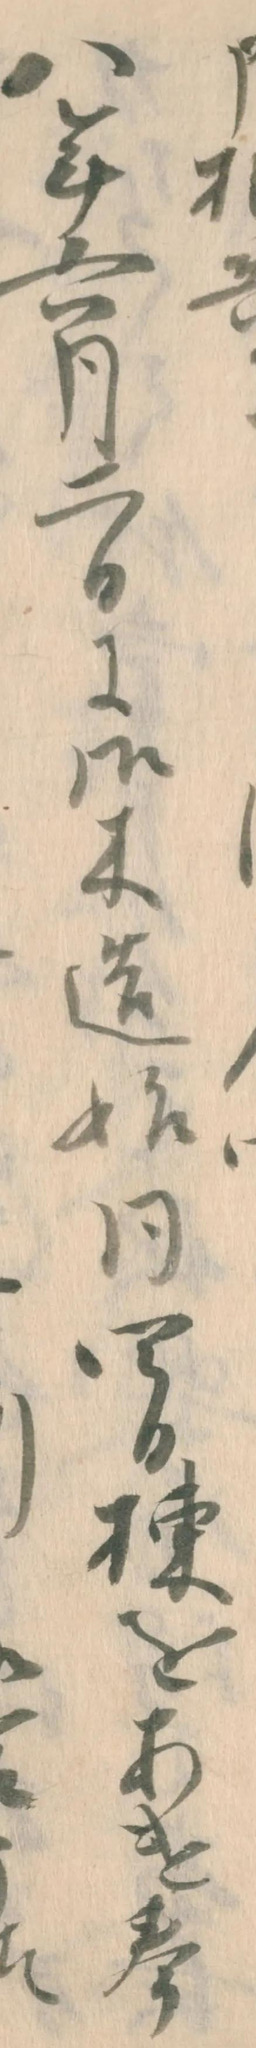八年六月二日に御木造始同四日棟をあけ奉
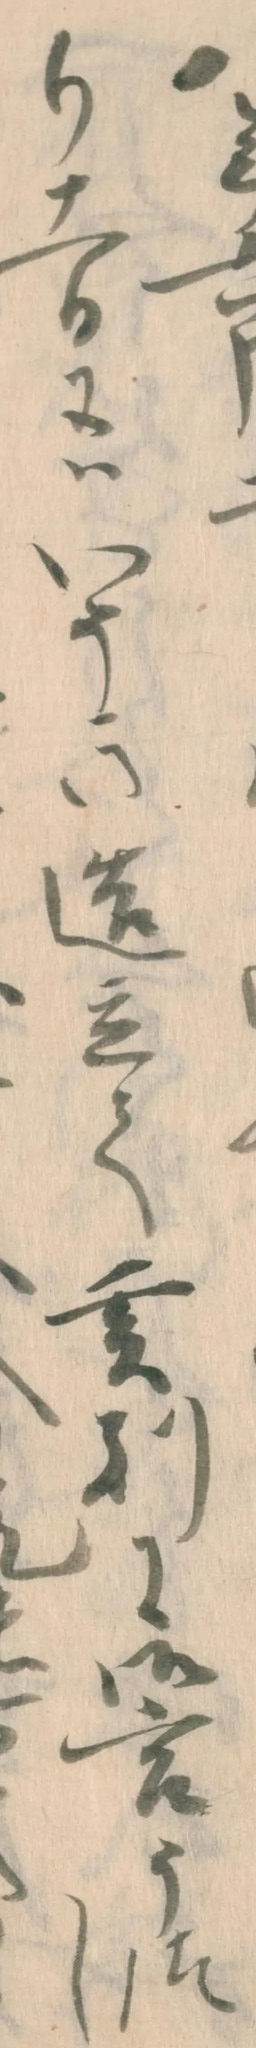り十一日にはいそき造立て亥刻に御宮うつし
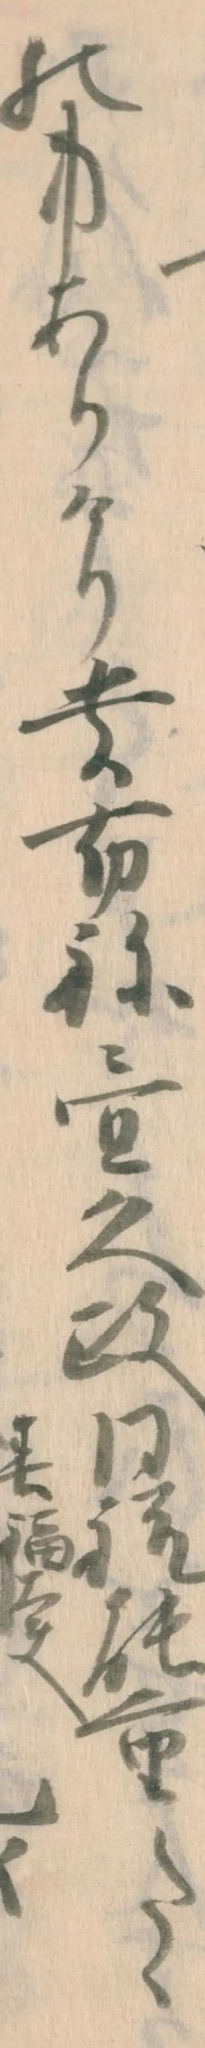の事ありけり貴ふね祢宜久政同祝能重たゝ
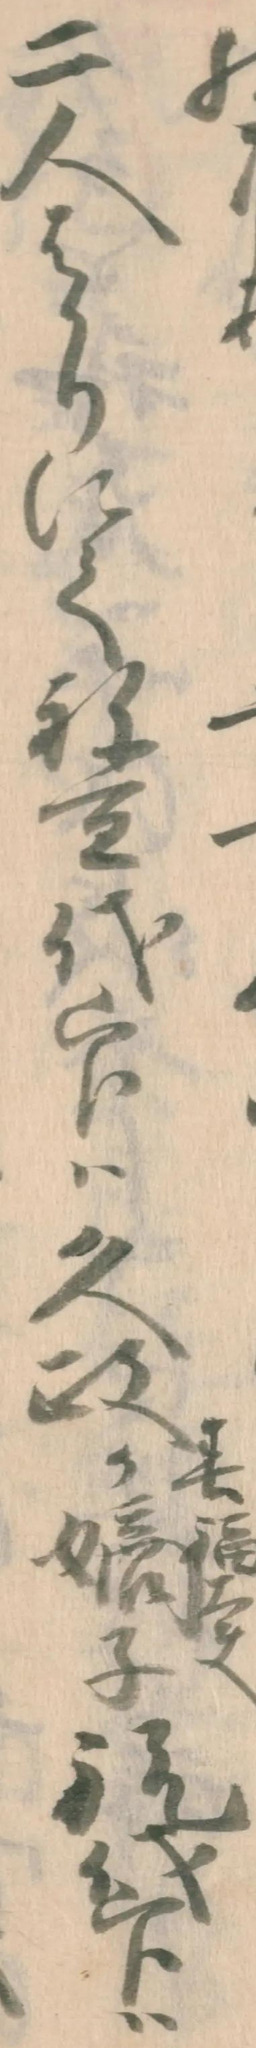二人はかりにて祢宜代官は久政か嫡子祝代官は
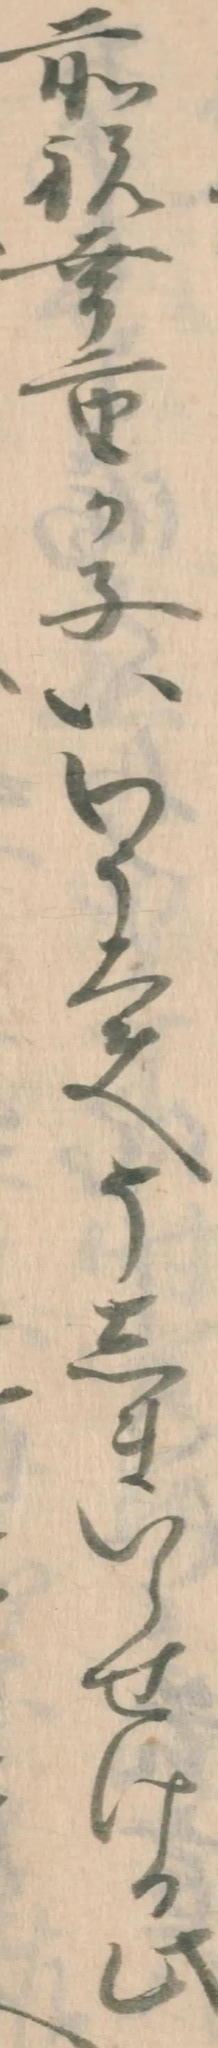前祝幸重か子いわう大夫そしまいらせける此
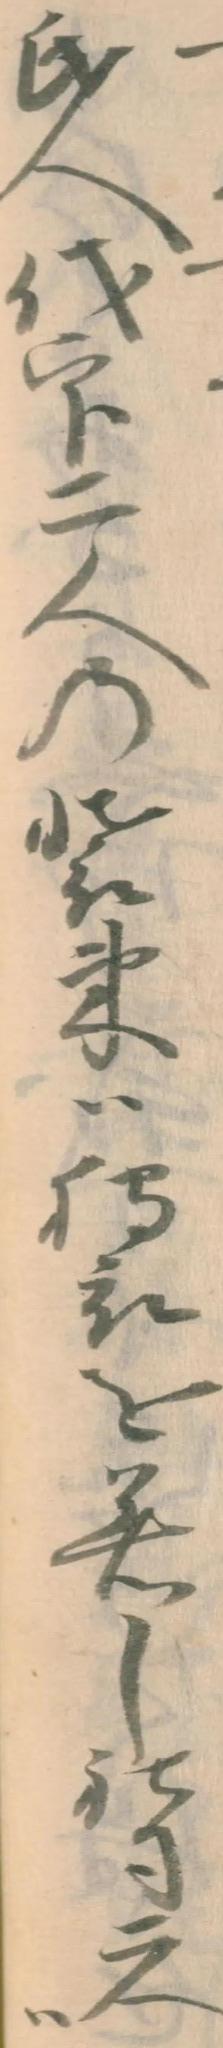氏人代官二人の装束は狩衣を着し社司二人は
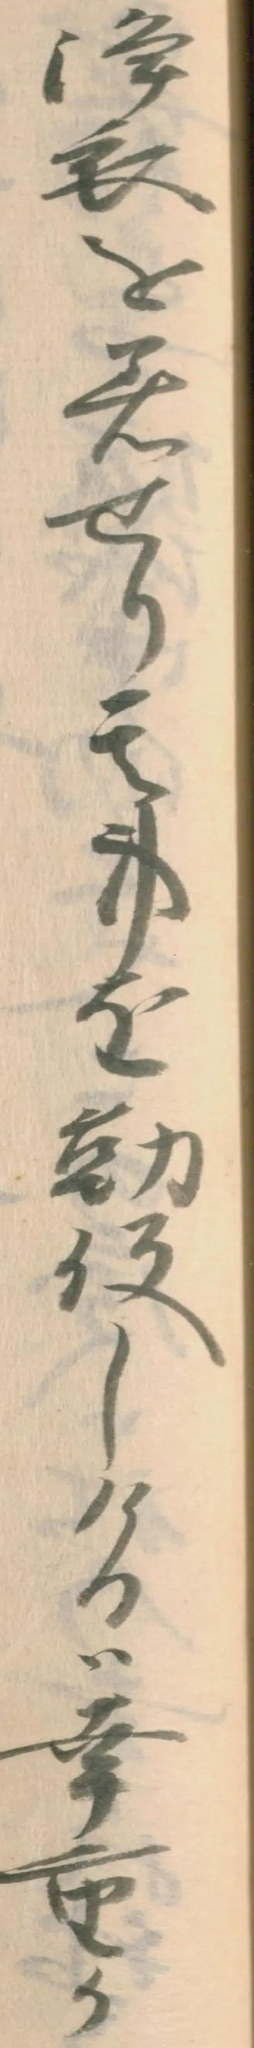浄衣を着せり其事を勤役しけるは幸重か
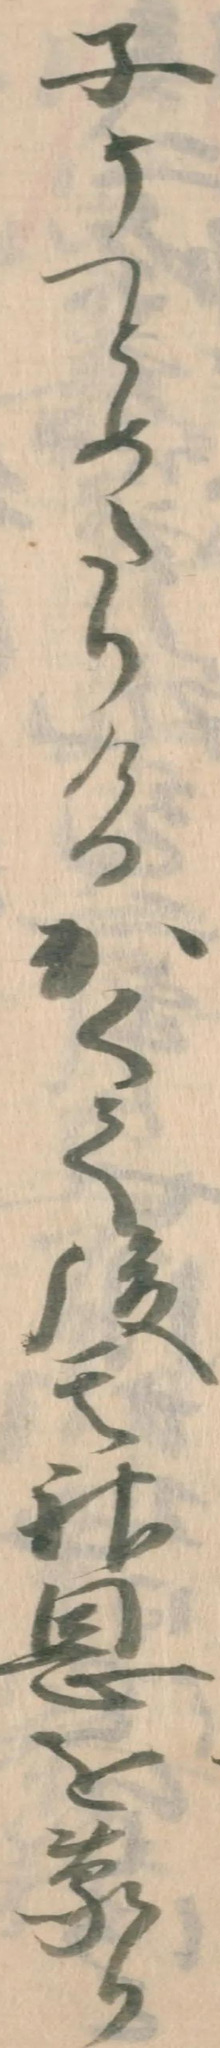子そつとめたりけるかくて後其神恩を蒙り
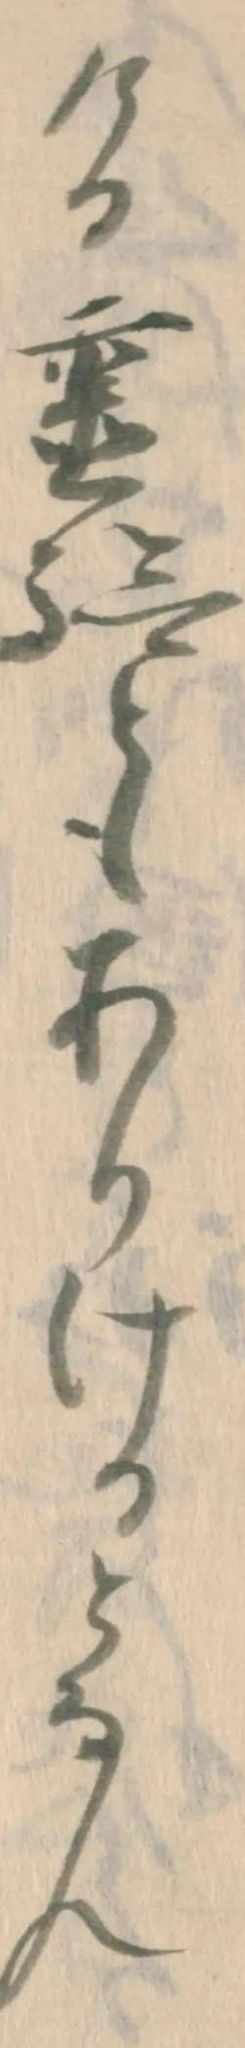ける霊験ともありけるとなん
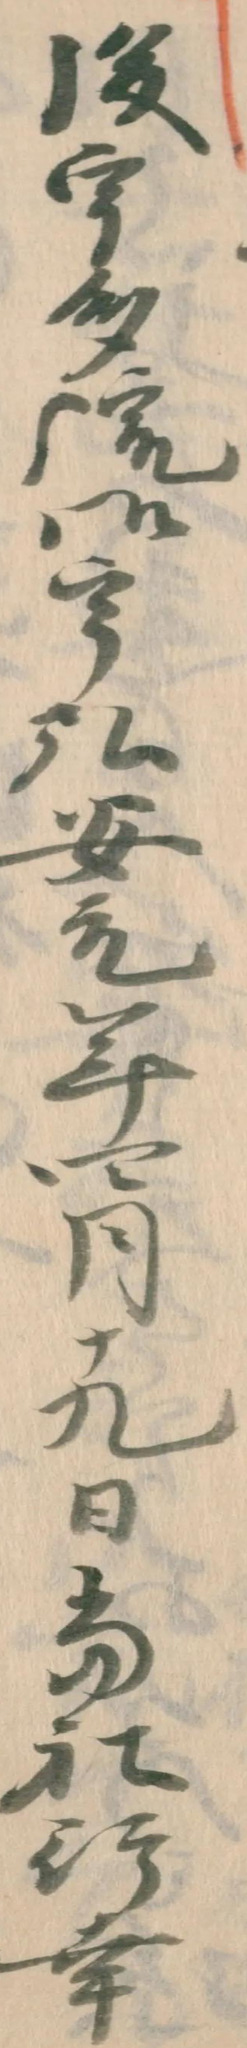後宇多院御宇弘安元年四月十九日当社行幸
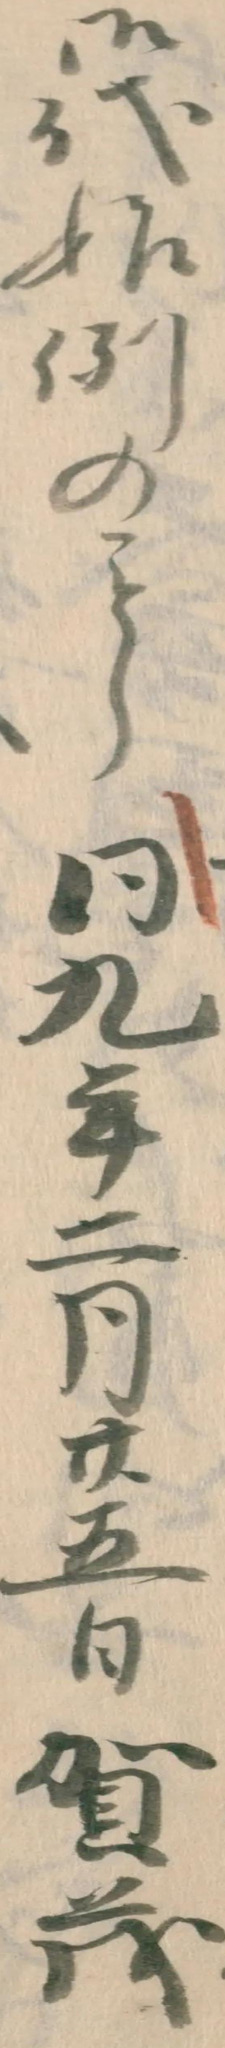御代始例のことし同九年二月廿五日賀茂
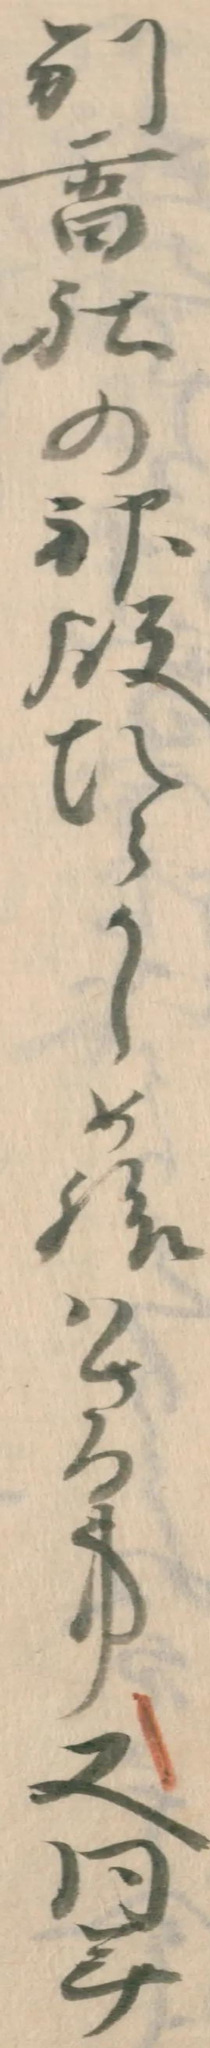別雷社の神殿ひらかしめ給はさる事又同年
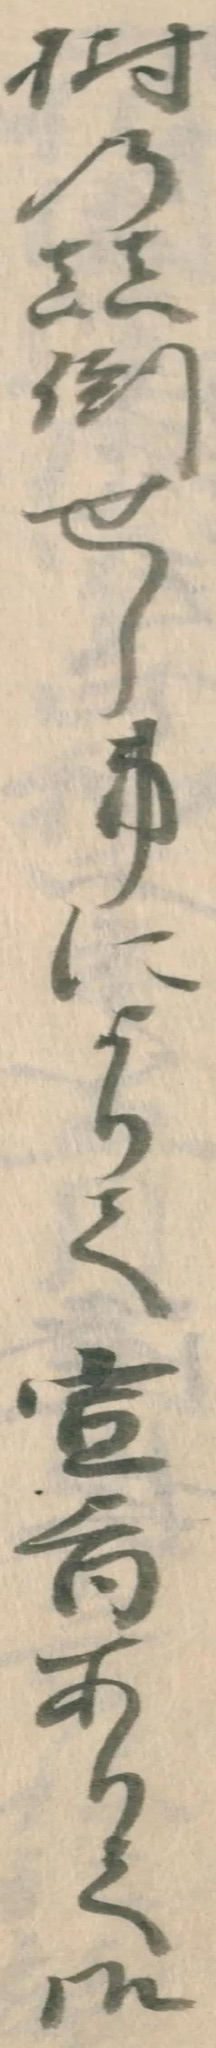樹の顛倒せし事によりて宣旨ありて御
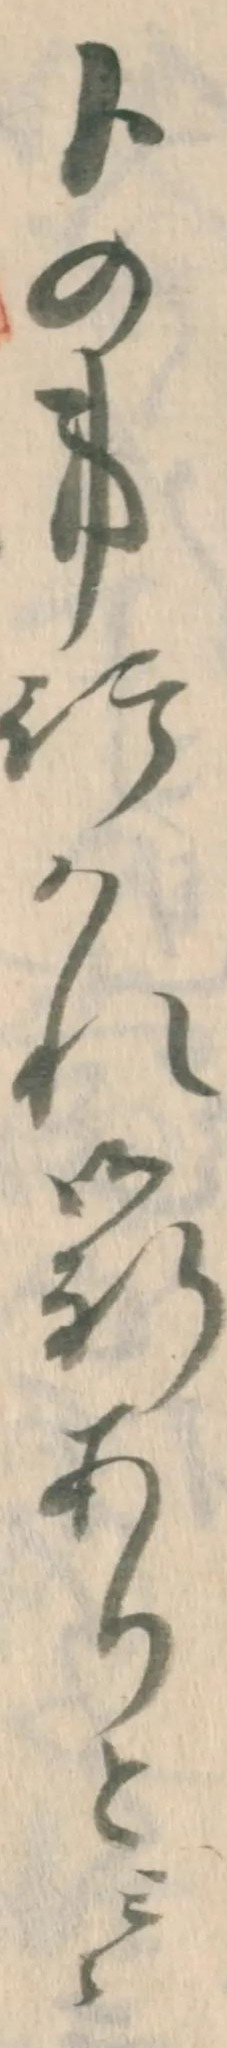卜の事行はれ御祈ありと云々
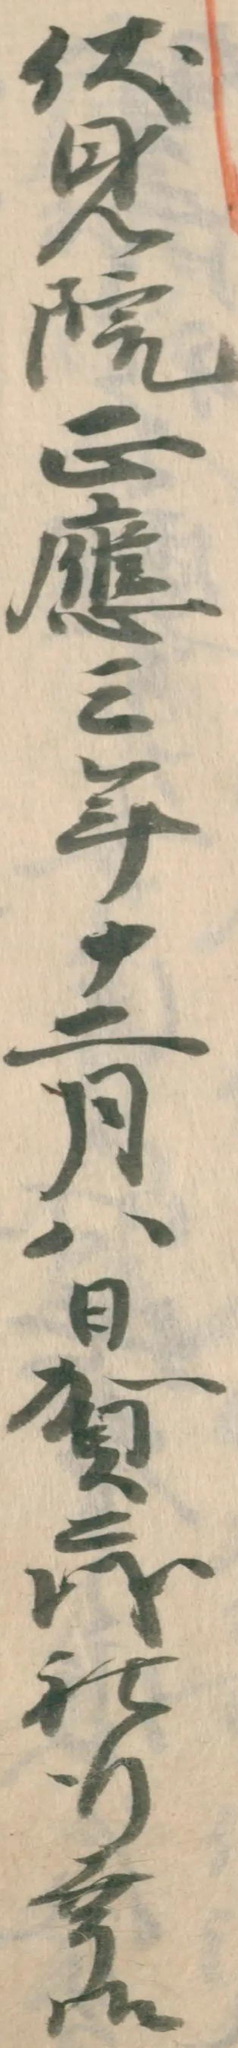伏見院正應三年十二月八日賀茂社行幸御
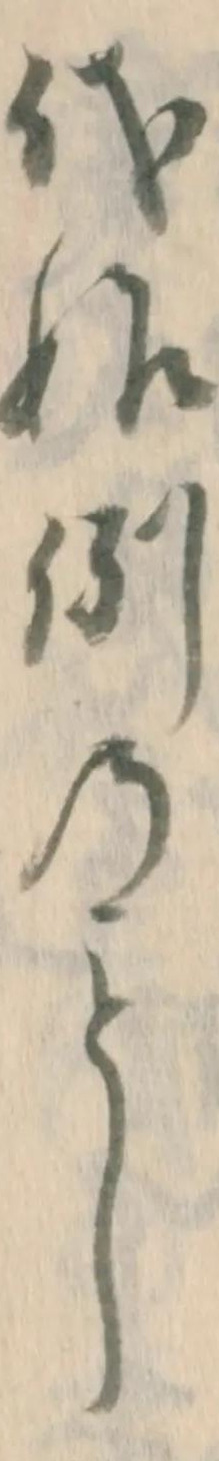代始例のことし
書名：賀茂社記録. 第1冊
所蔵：国立国会図書館 National Diet Library, JAPAN
